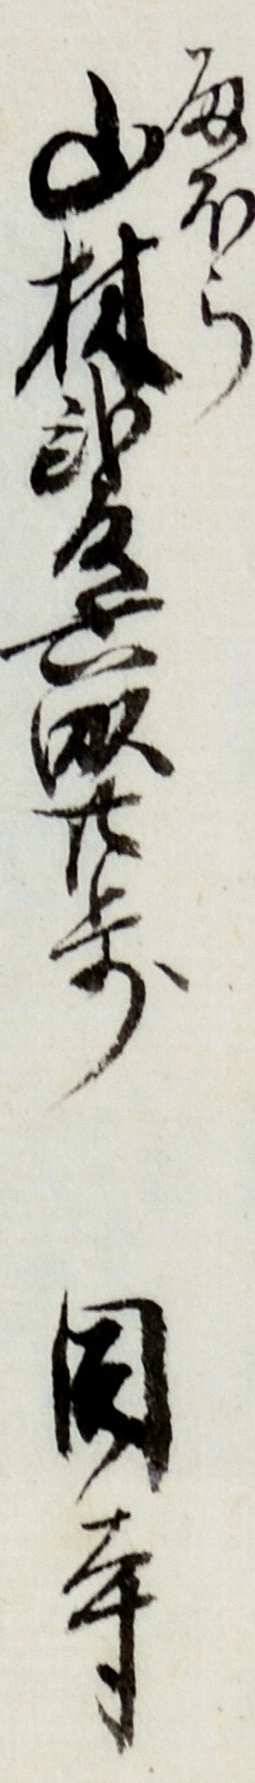山林弐反六畝廿歩同寺
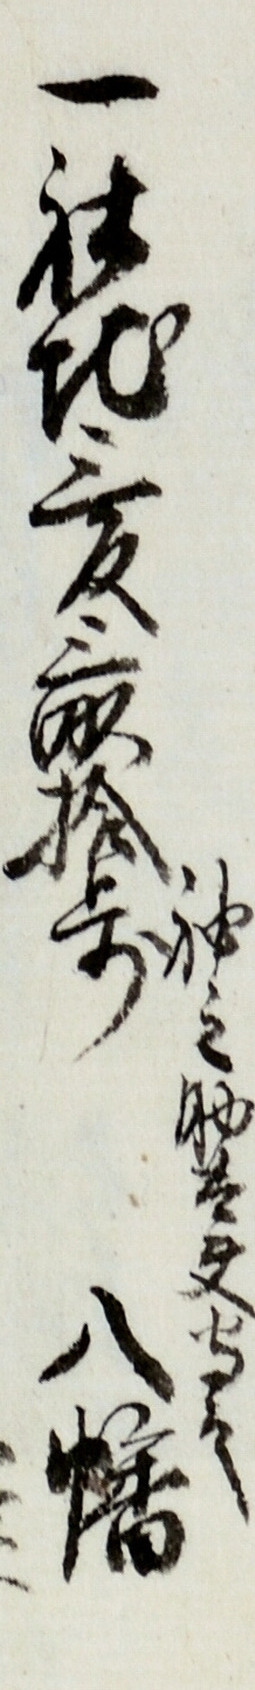一社地三反三畝拾歩八幡
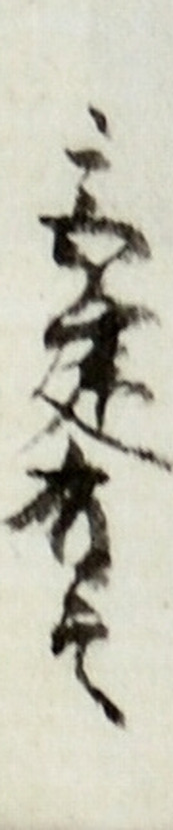宮建有之
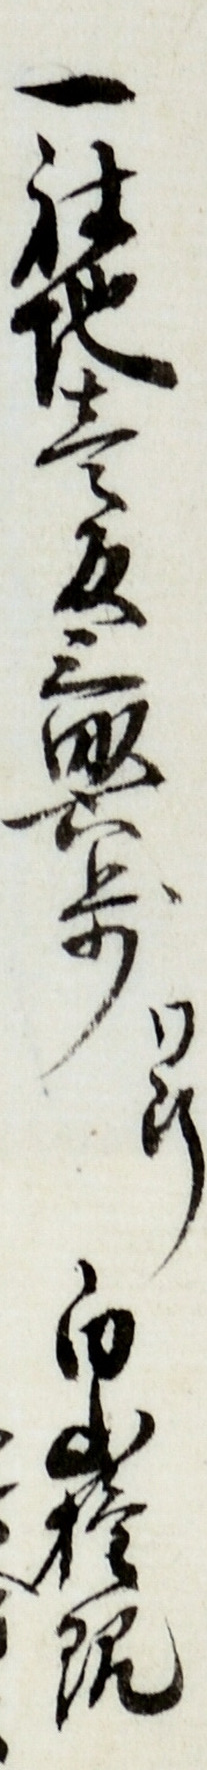一社地壱反三畝六歩白山権現
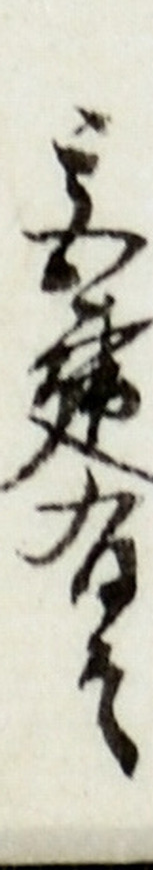宮建有之
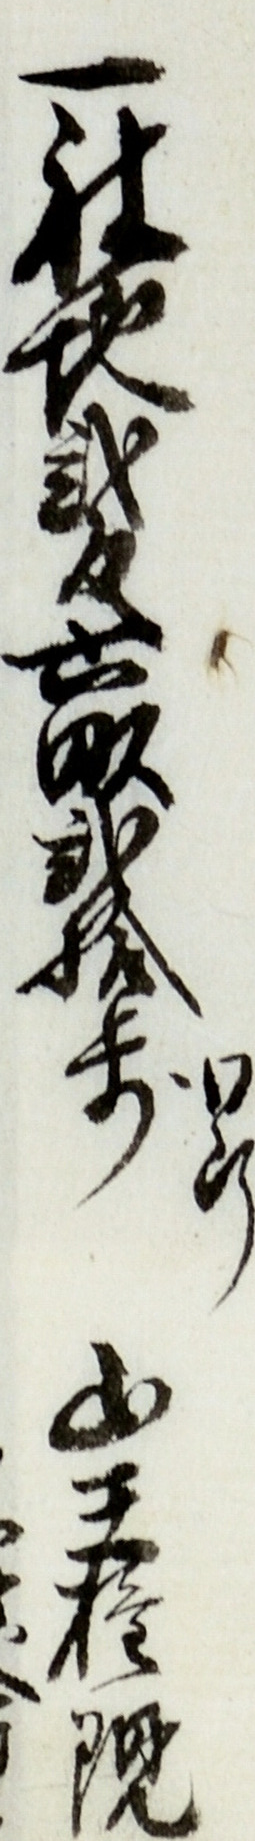一社地弐反六畝弐拾歩山王権現
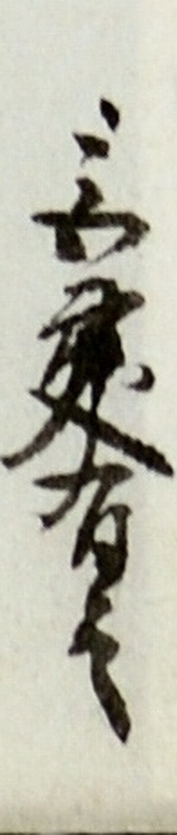宮建有之
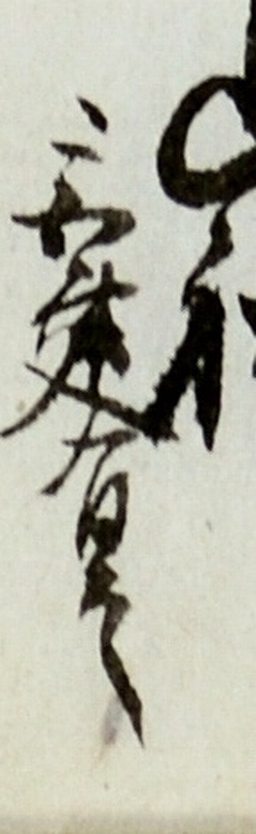宮建有之
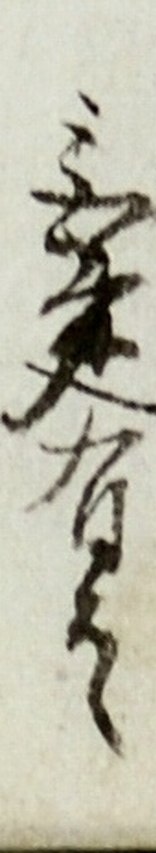宮建有之
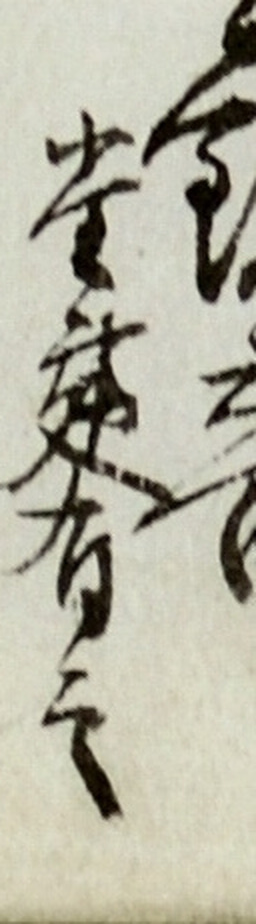堂建有之
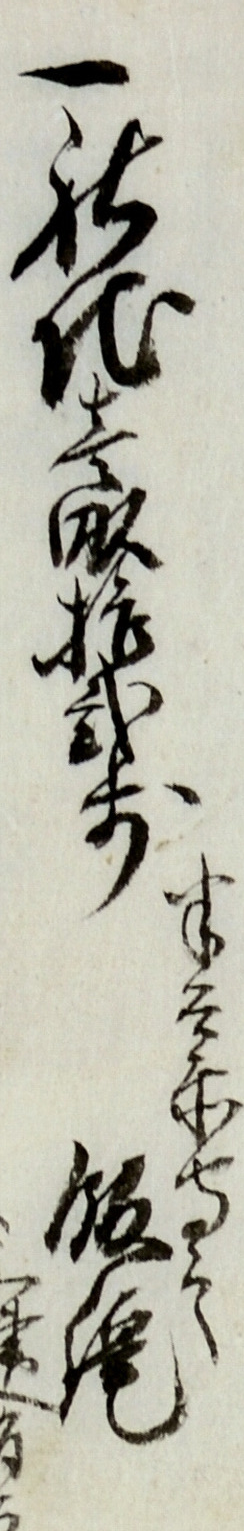一社地壱畝拾弐歩飯縄
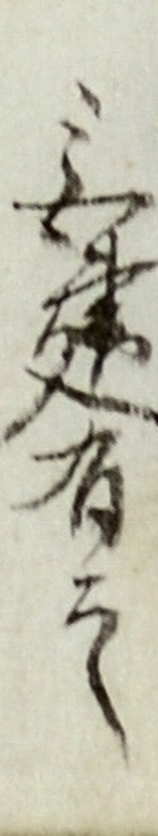宮建有之

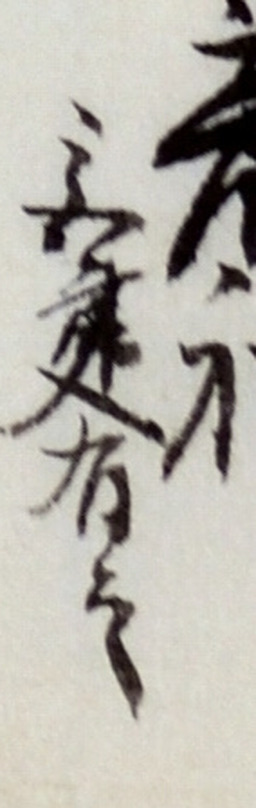宮建有之
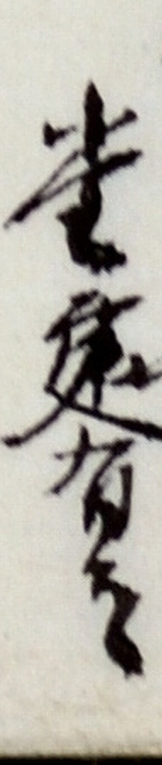堂建有之
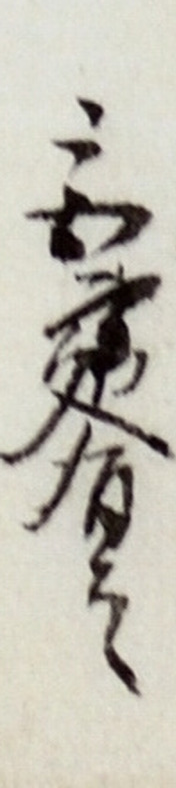宮建有之
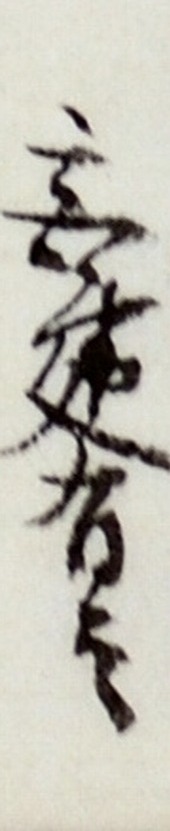宮建有之
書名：御領分中山林社地手控
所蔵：伊那市立高遠町図書館・合同会社AMANE
